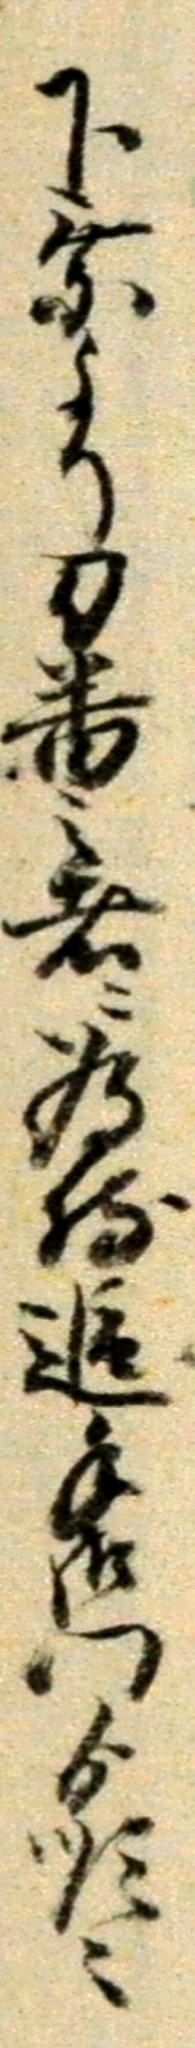下乗より刀番之者ニ為持追手御門ゟ順々
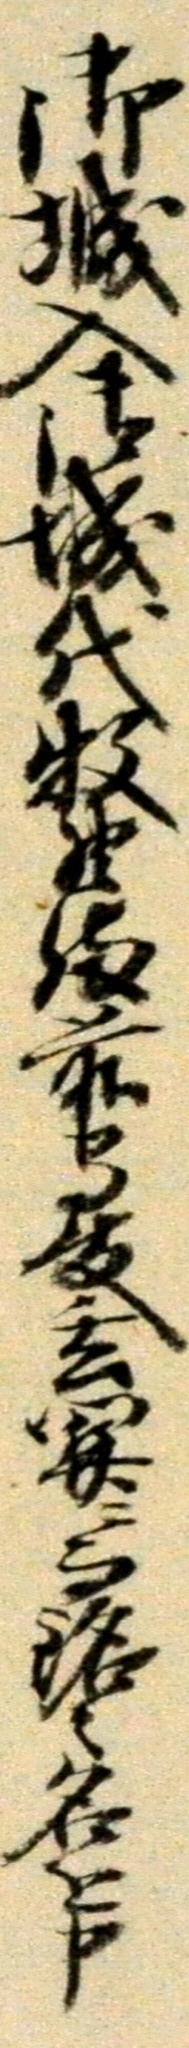御城入御城代牧野備前守殿玄関ニ而銘々名を申
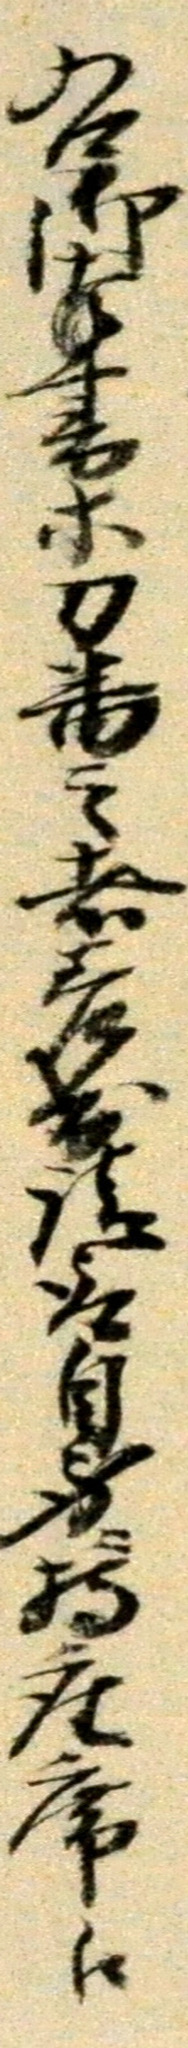右御奉書等刀番之者差出請取自身ニ持座席え
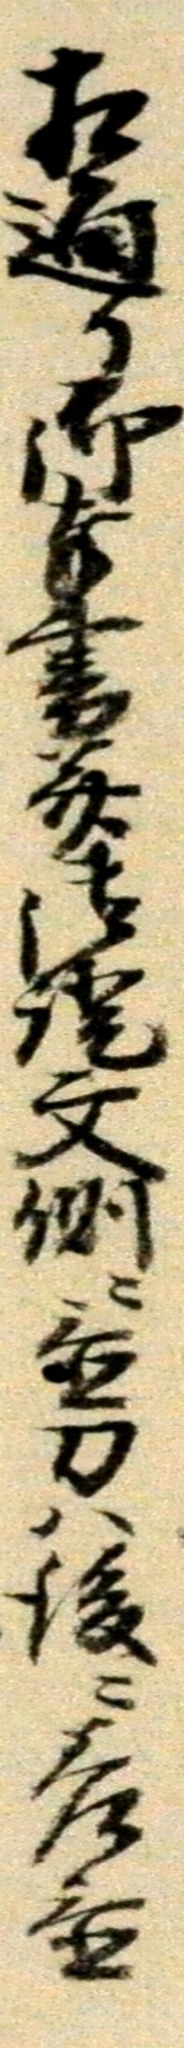相通り御奉書并御證文側ニ置刀ハ後ニ差置
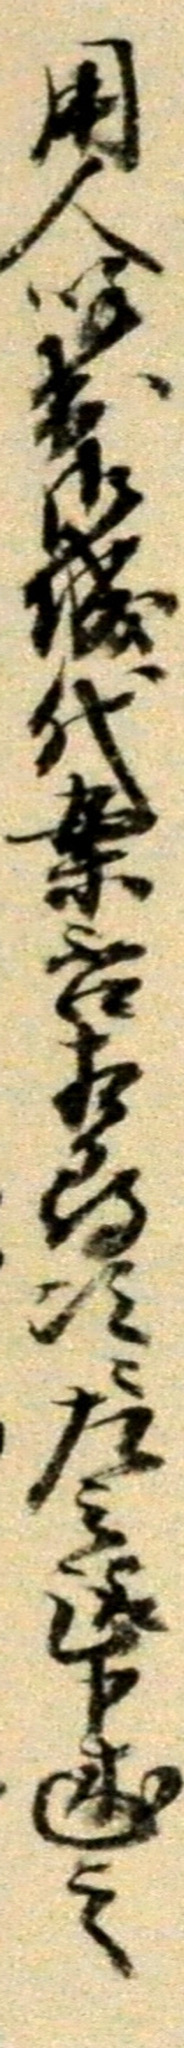用人呼出御城代案否相尋次ニ左之趣申述之
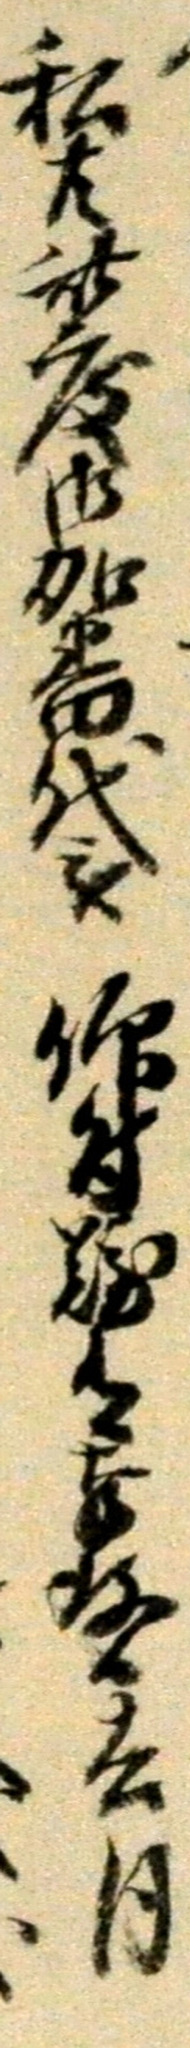私共此度御加番代被仰付難有奉存候去月
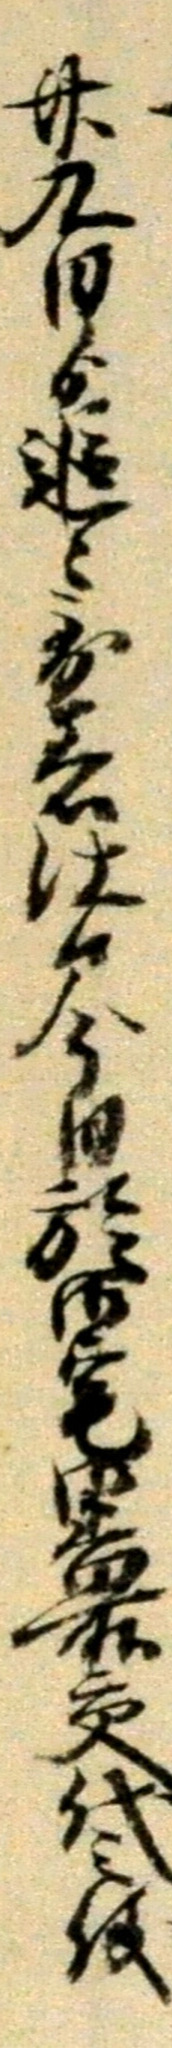廿九日ゟ追々到着仕候今日於御宅御番所交代之儀
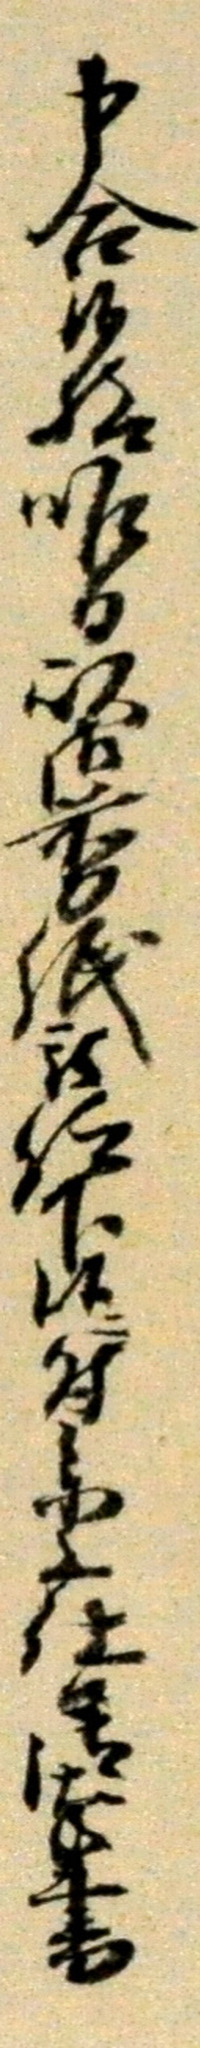申合候様昨日以御剪紙被仰下候ニ付参上仕候御奉書
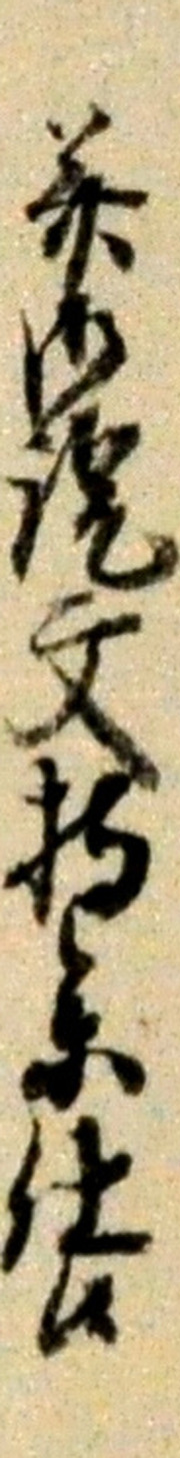并御證文持参仕候
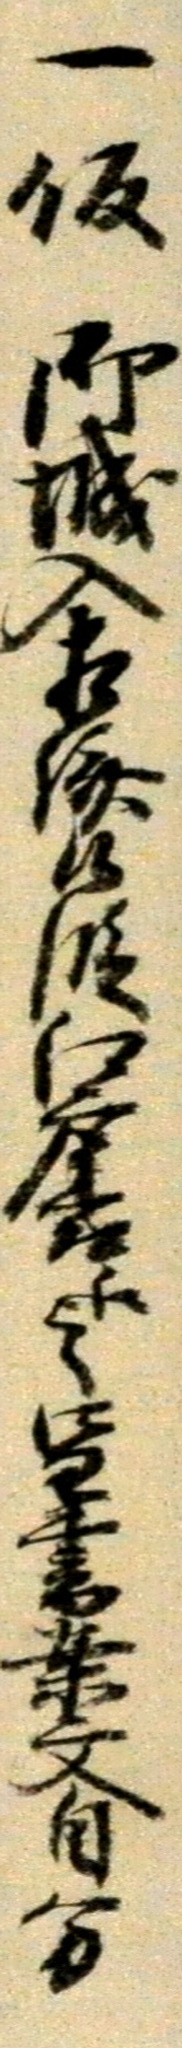一仮御城入相済候段江戸表え之呈書案文自分
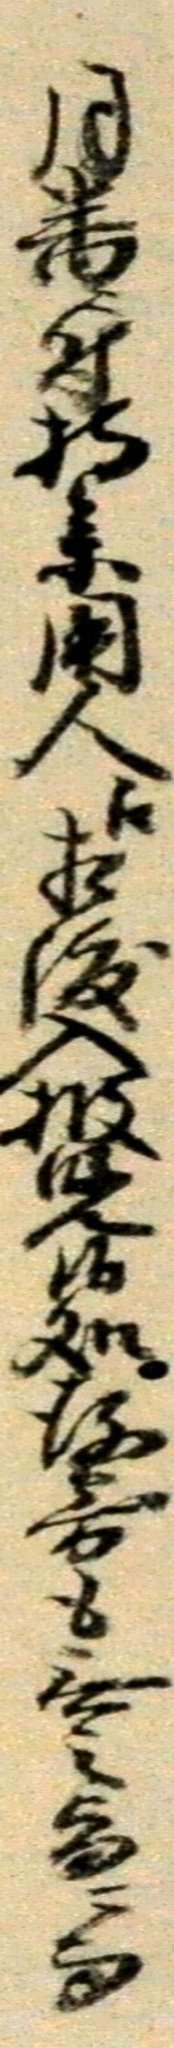月番ニ付持参用人え相渡入披見候処存寄も無之旨ニ而
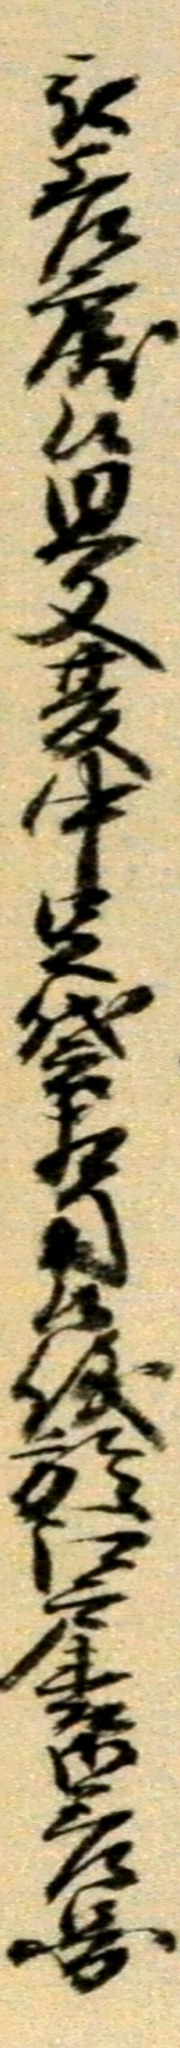被差戻候且又夏中足袋相用候儀於江戸表御差図
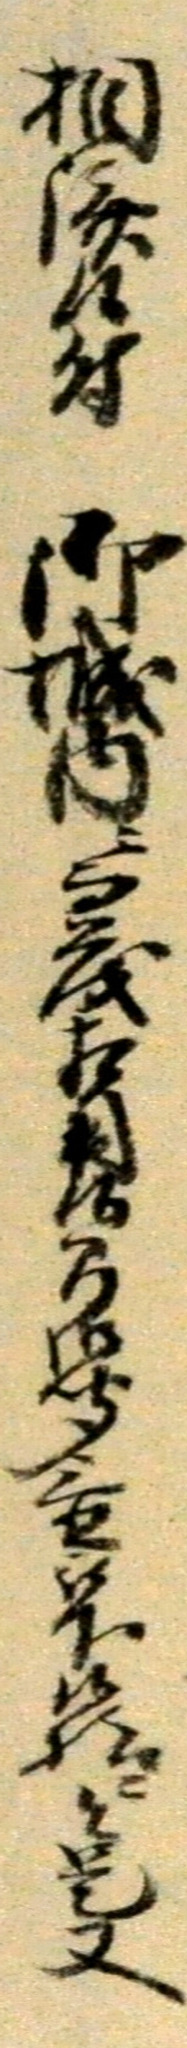相済候付御城内ニ而も相用候間御聞置被下候様ニと是又
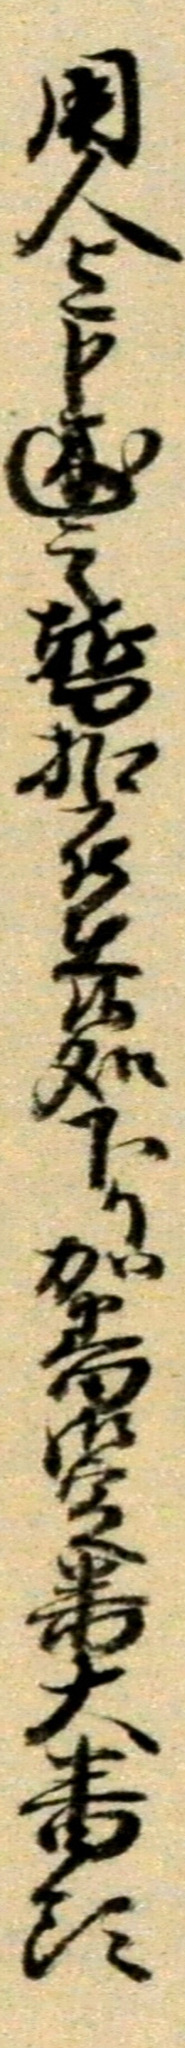用人迄申述之暫扣罷在候処下り加番御定番大番頭
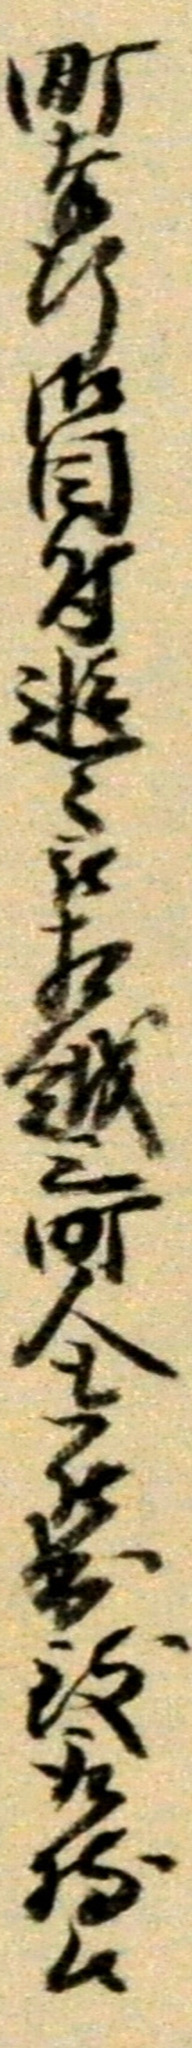町奉行御目付追々被相越三町人も罷出致取持候
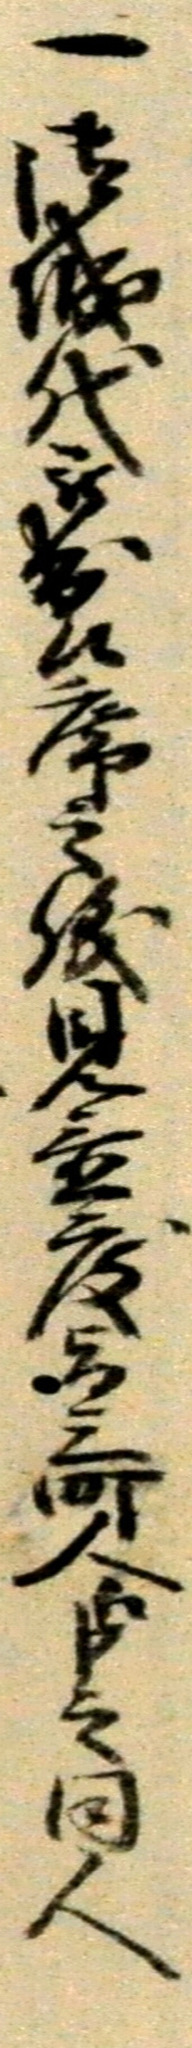一御城代被出候席之儀見置度旨三町人え申之同人
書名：大阪加番関係諸書留〔一括〕
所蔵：伊那市立高遠町図書館・合同会社AMANE
